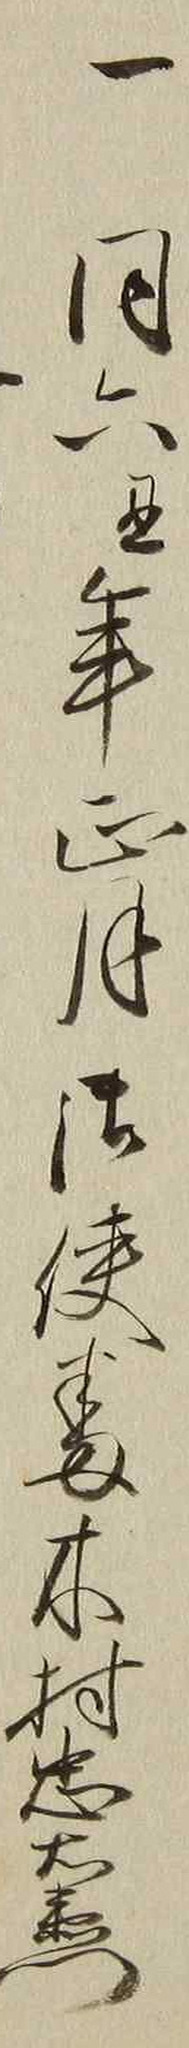一同六丑年正月御使番木村忠右衛門
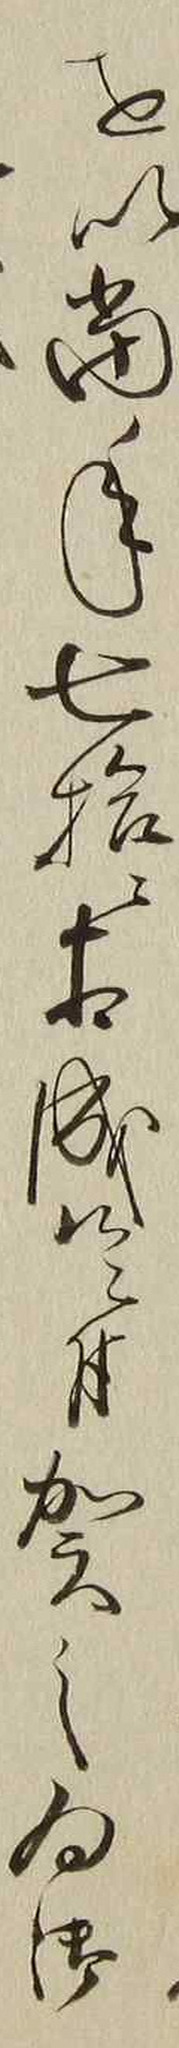を以当年七拾相成候に付賀之為御
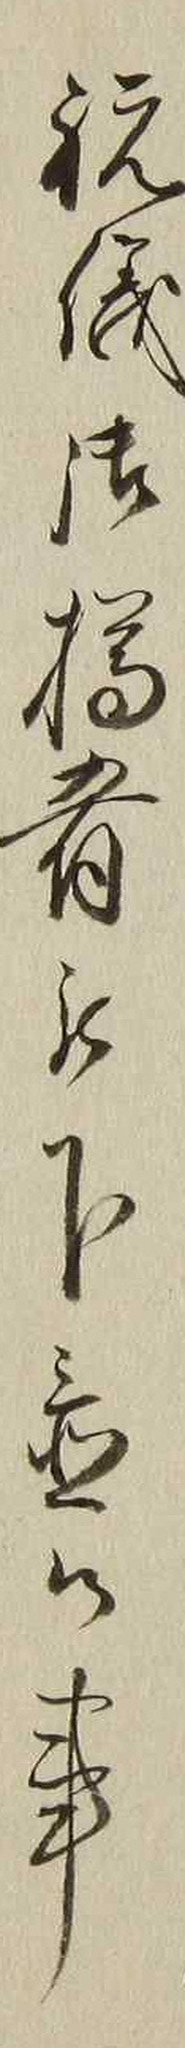祝儀御樽肴被下置候事
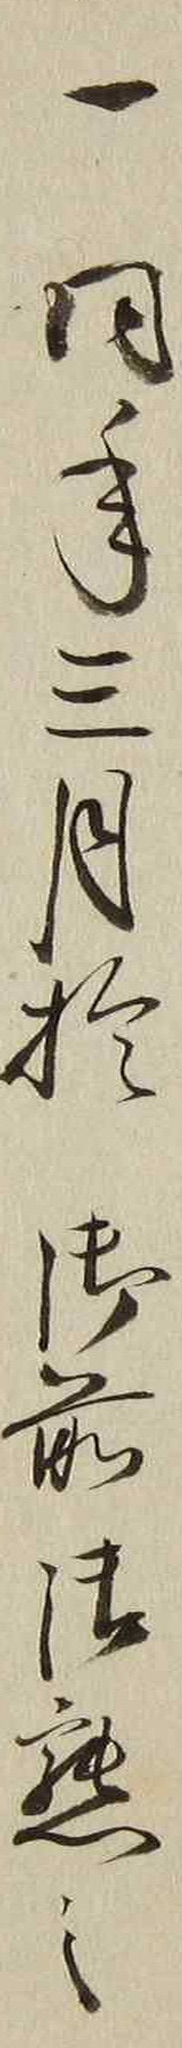一同年三月於御前御懇之
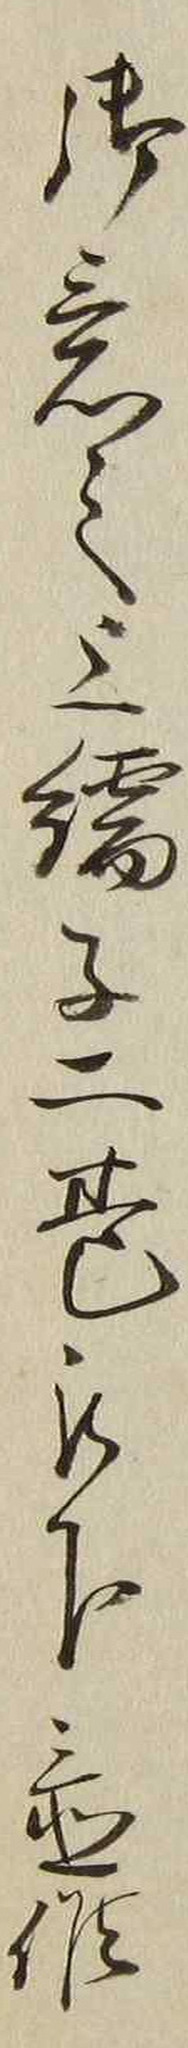御意之三繻子二巻被下置候
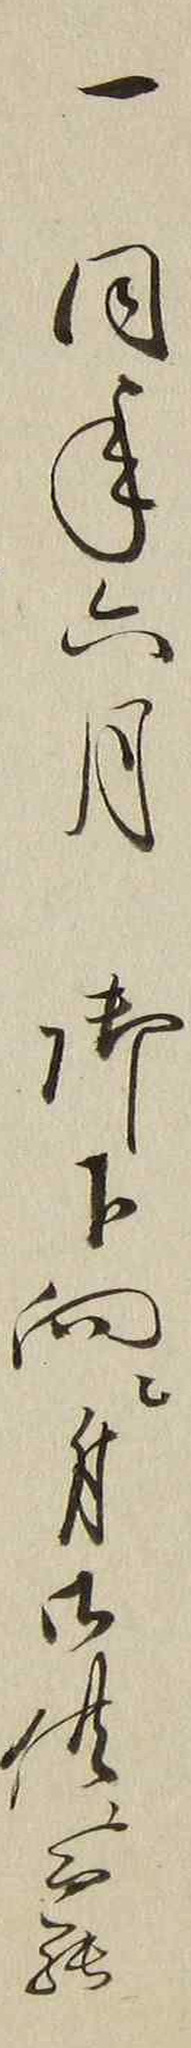一同年六月御下向に付御供に而罷
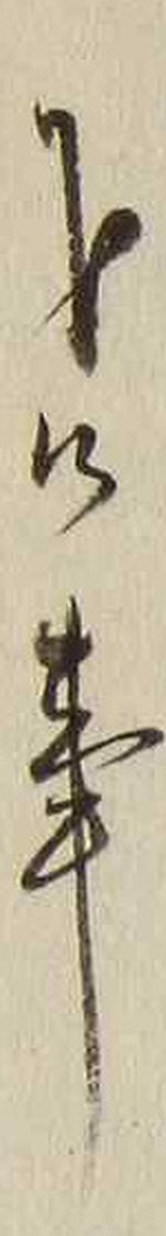下候事
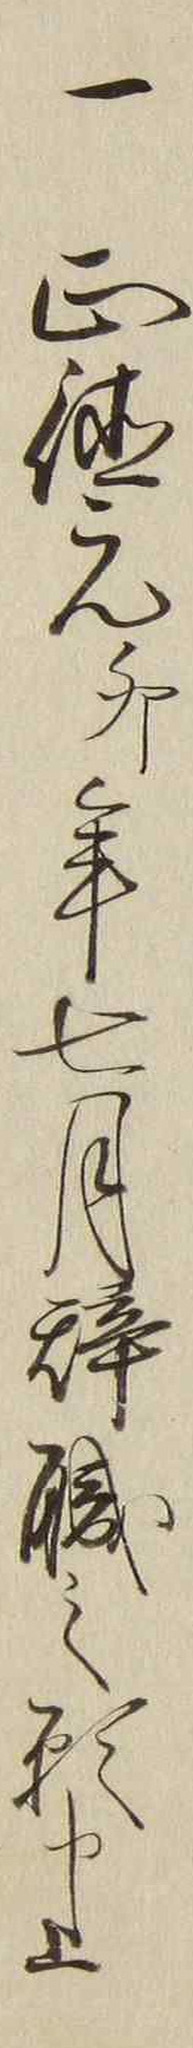一正徳元卯年七月辞職之願申上

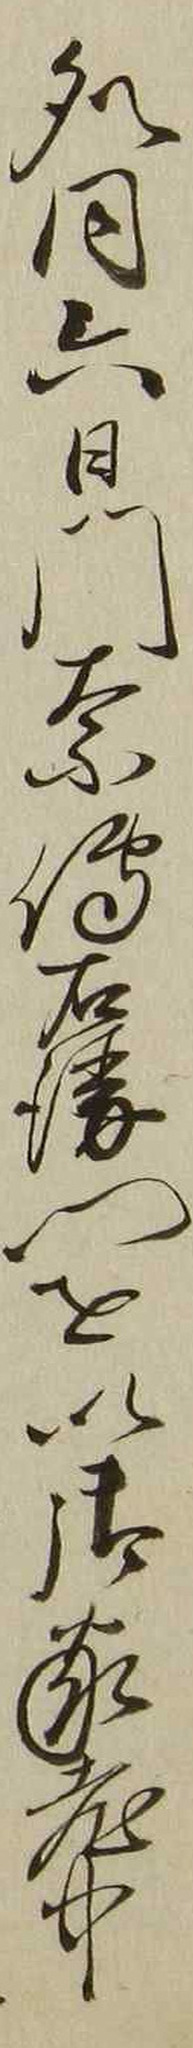処同六日門奈伝右衛門を以御家老中
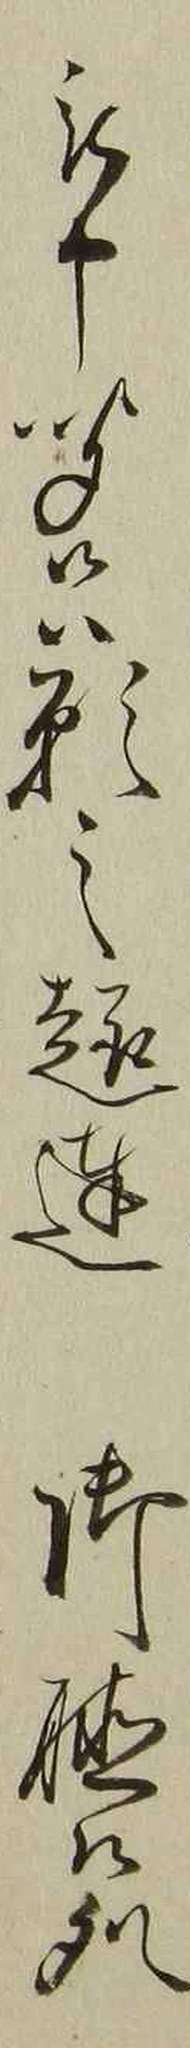被申聞候は願之趣達御聴候処
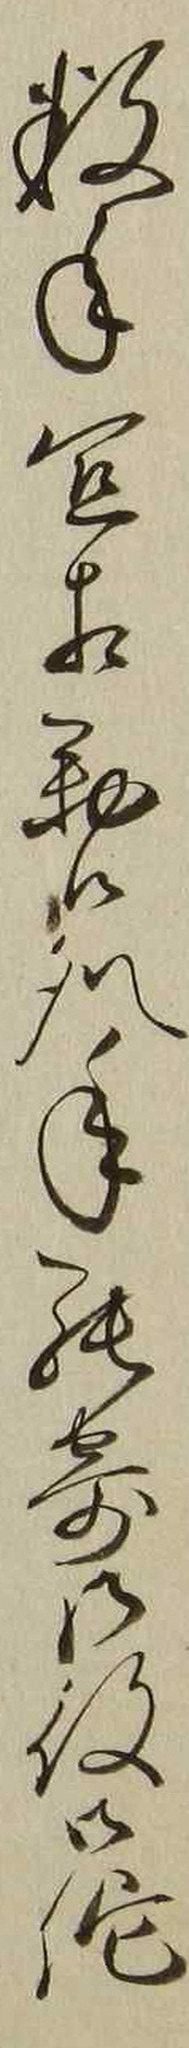数年宜相勤候処年罷寄御役御佗
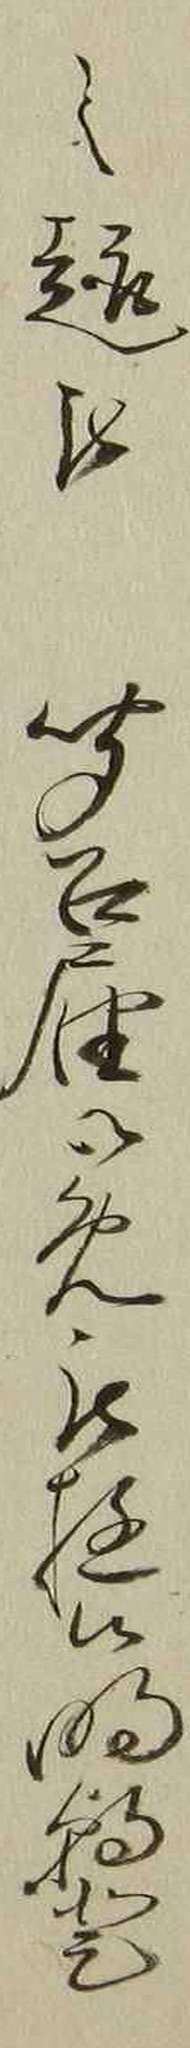之趣被聞召届御免被遊候明朝登
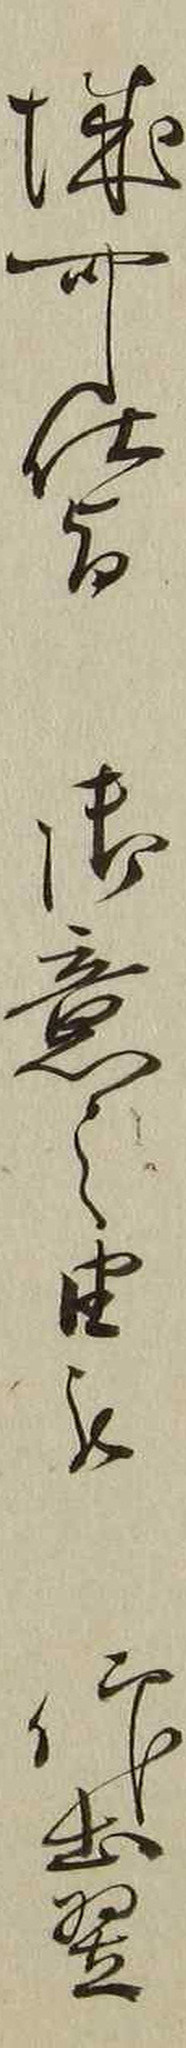城可仕旨御意之由被仰出翌
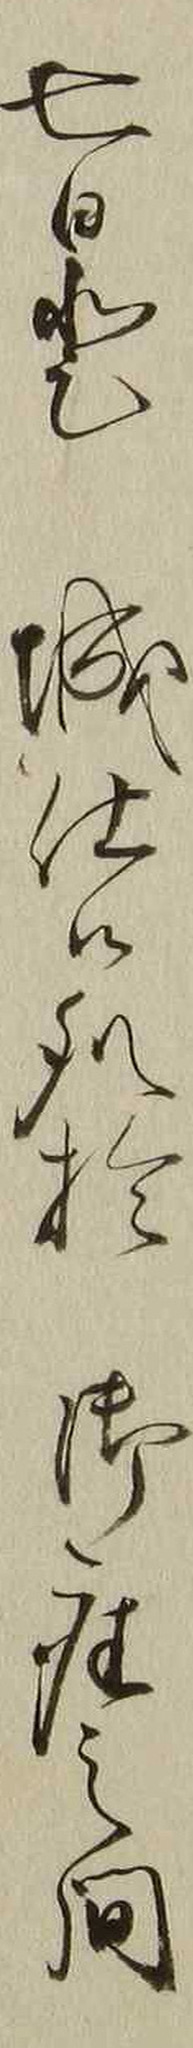七日登城仕候処於御座之間
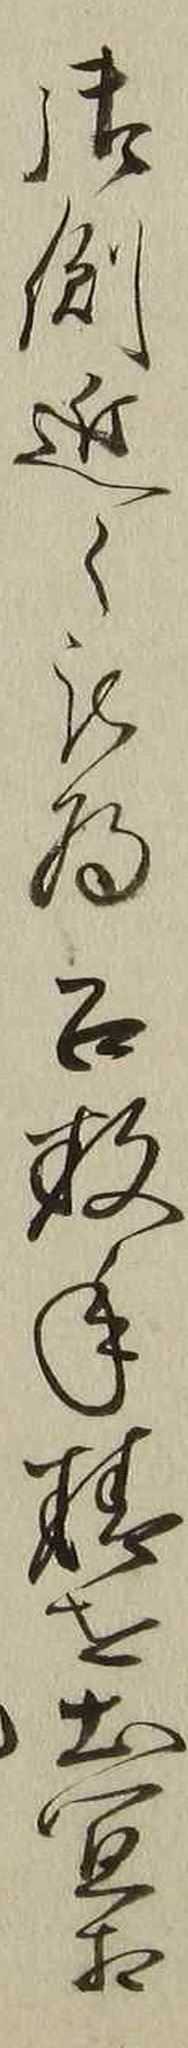御側近く被為召数年精を出宜相
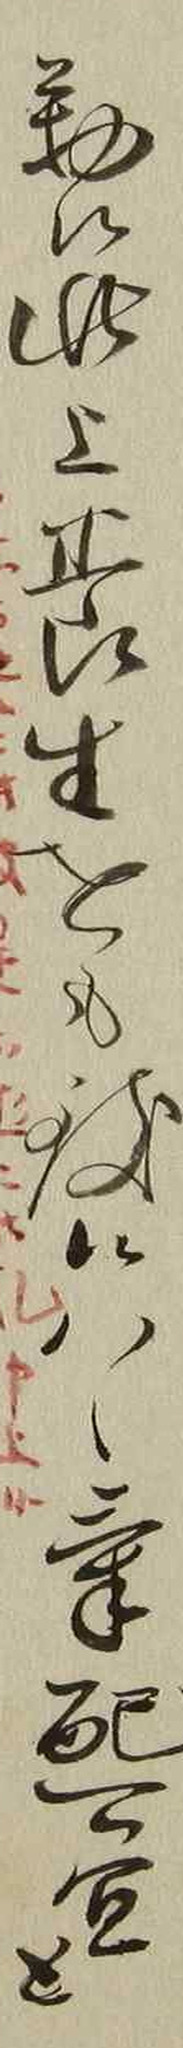勤候此上養生をも致候はゝ気配可宜と
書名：諸士系譜　巻之103　か之部11
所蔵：会津若松市立会津図書館
